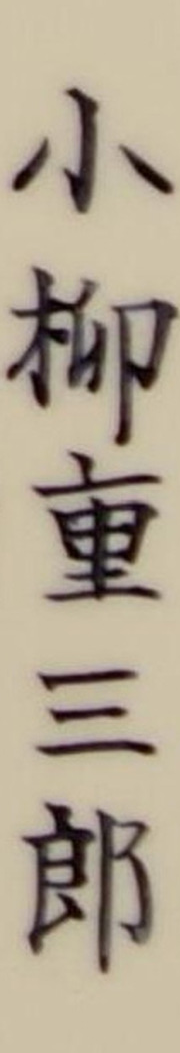小柳重三郎
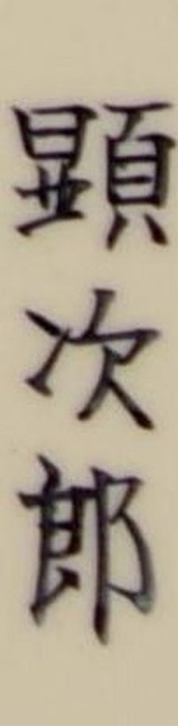顕次郎
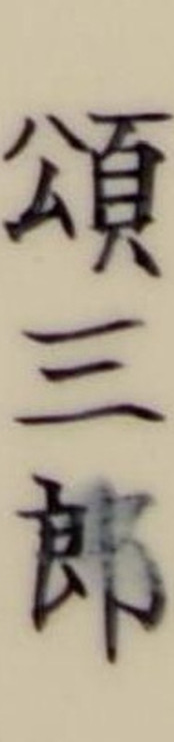頌三郎
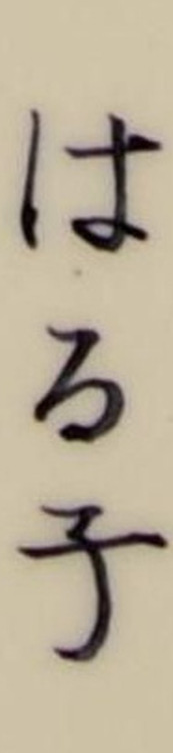はる子
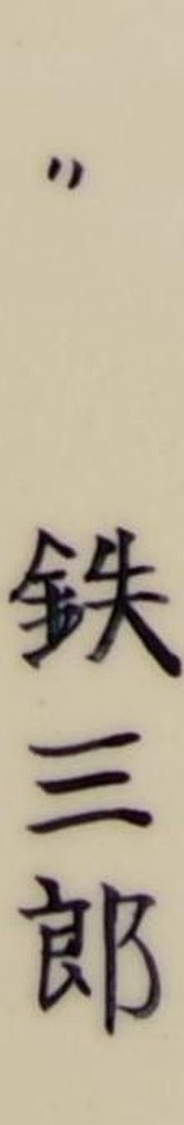鉄三郎
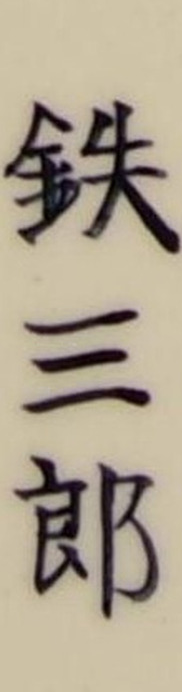鉄三郎
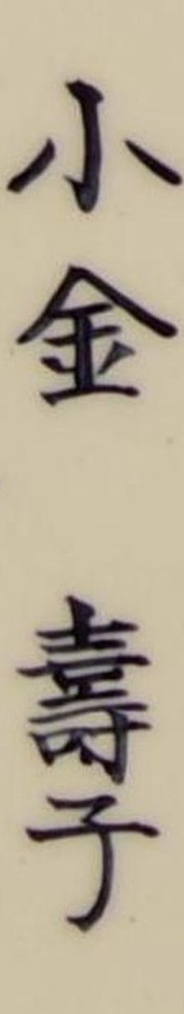小金壽子
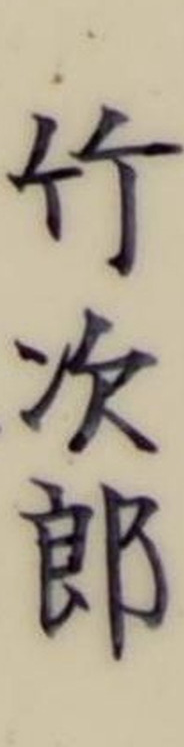竹次郎
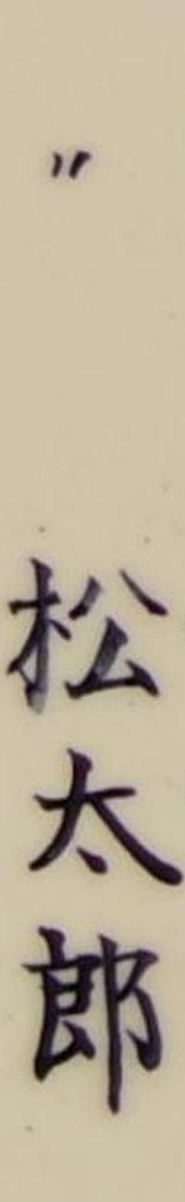松太郎
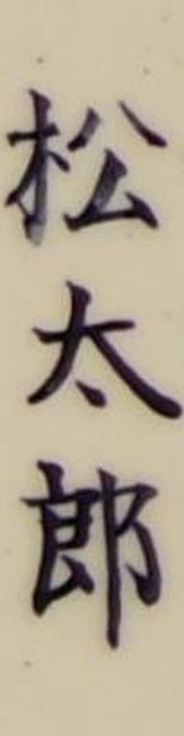松太郎
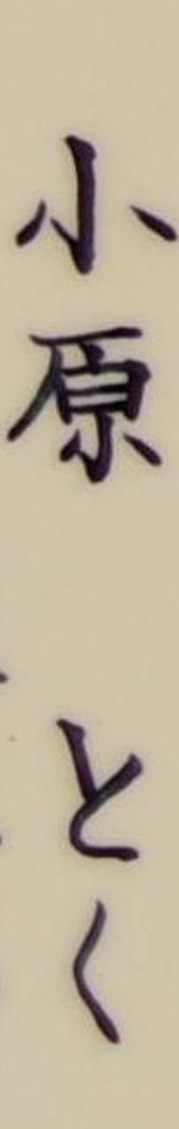小原とく
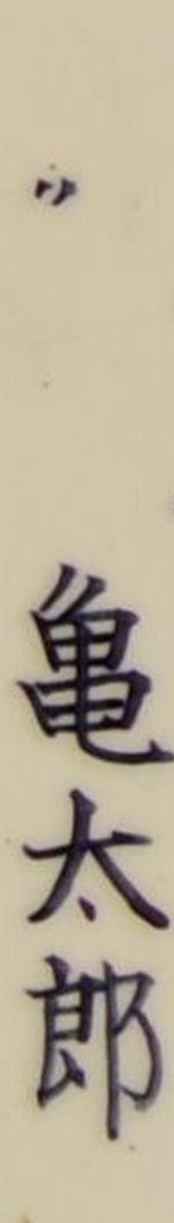亀太郎
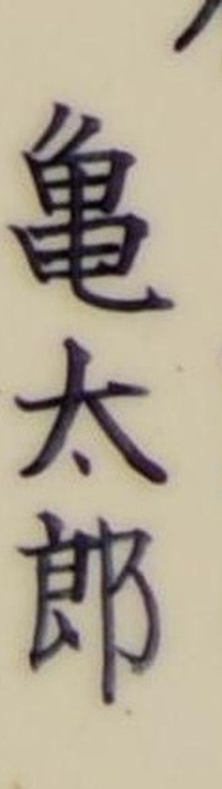亀太郎

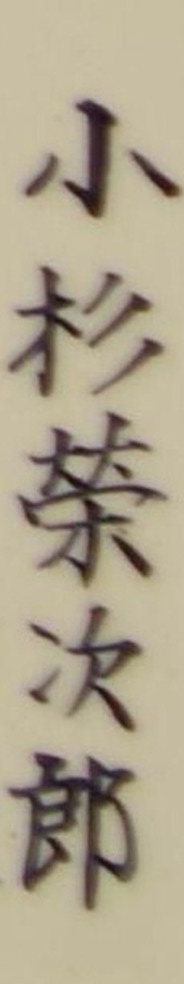小杉榮次郎
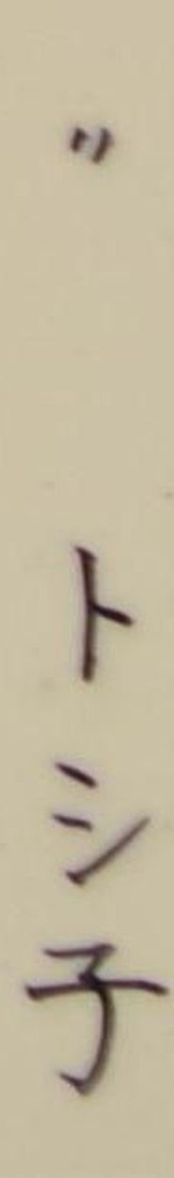トシ子
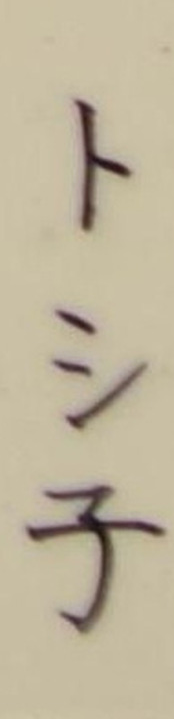トシ子
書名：E~L
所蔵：高野山金剛峯寺
